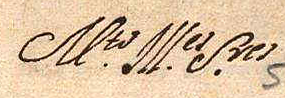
M.to Ill.es S.res
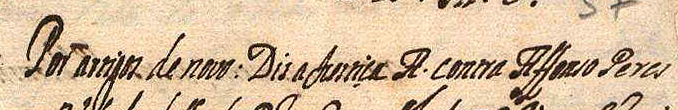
Por artigos de novo: Dis a Justiça R. contra Affonso Peres
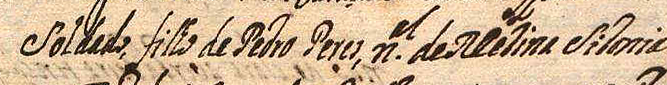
Soldado, filho de Pedro Peres, n.al de Medina Sidonia
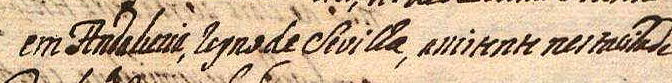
em Andaluzia, Reyno de Sevilha, assistente nesta cidade
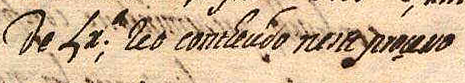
de Lx;a Reo contheudo neste processo
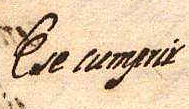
E se cumprir
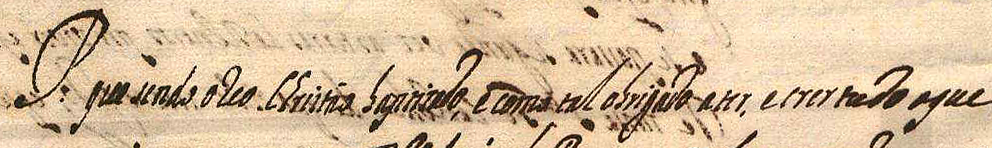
P. que sendo o Reo Christão baptizado, e como tal obrigado a ter, e crer tudo o que
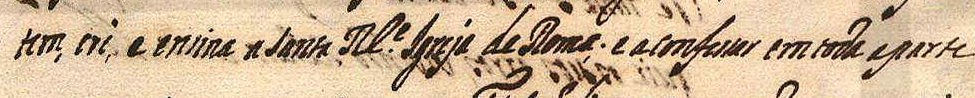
tem, crè, e ensina a santa M.e Igreja de Roma; e a confessar em toda a parte
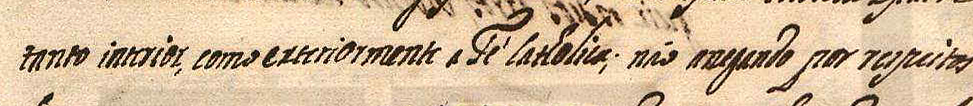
tanto interior, como exteriormente a Fé catholica; naõ a negando por respeitos
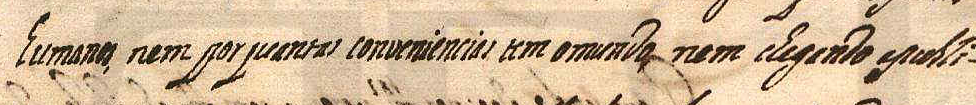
humanos, nem porquantas conveniencias tem o mundo nem chegando a publi
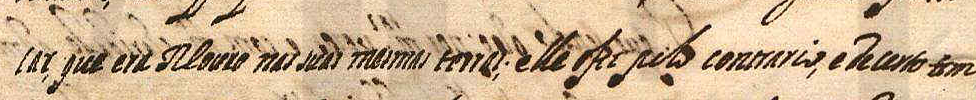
car, que era Mouro nas suas mesmas terras; elle o fez pelo contrario, e de certo tem
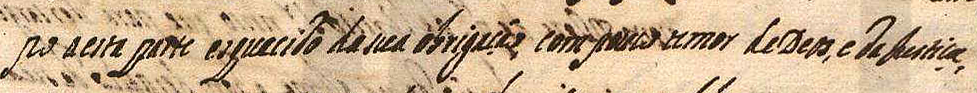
po a esta parte esquecido da sua obrigação com pouco temor de Deos, e da Iustiça,
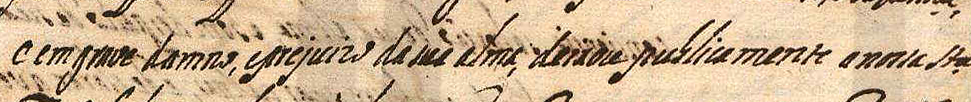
e em grave damno, e prejuizo da sua alma, deixou publicamente a nossa st.a
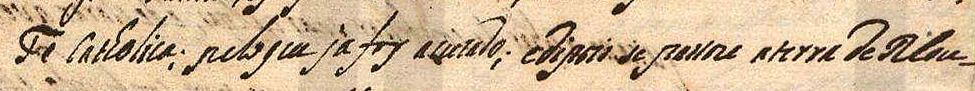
Fe catholica; pelo que ja foy acuzado; e dipois se passou a terra de Mou
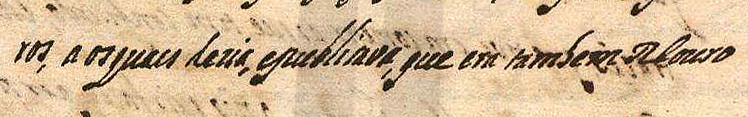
ros, aos quaes dezia, e publicava, que erá tambem Mouro
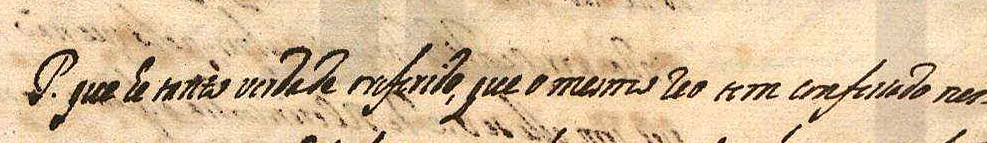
P. que he tanto verdade o referido, que o mesmo Reo tem confessado nes
